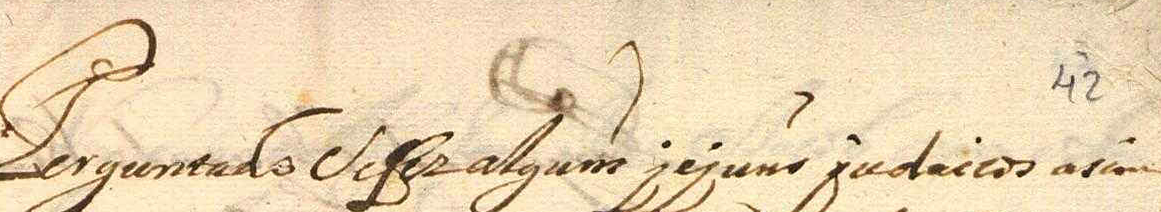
Perguntado se fez algum̄ jejun̄s judaicos asim
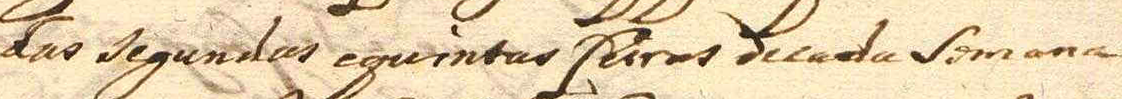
das segundas e quintas feiras de cada Somana
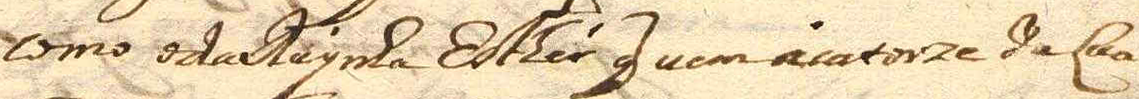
como o da Raynha Esthér q̄ uem a catorze da Lua
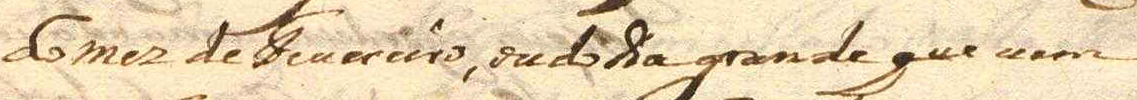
do mez de Feuereiro, ou do dia grande que uem
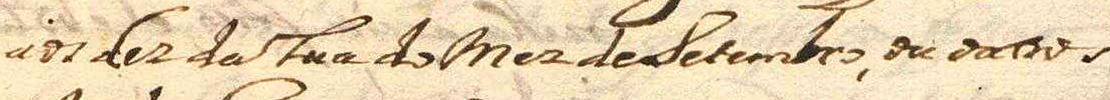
aos dez da lua do Mez de Setembro, ou outros
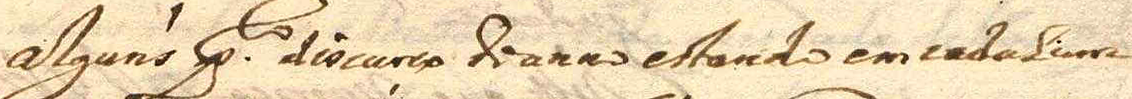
algun̄s p.lo discurço do anno estando em cada hum
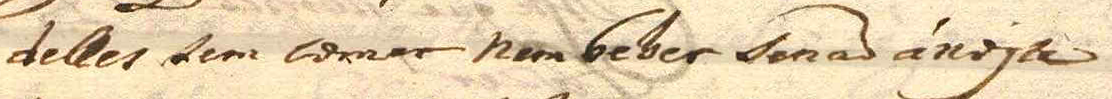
delles sem comer nem beber senaõ á noyte
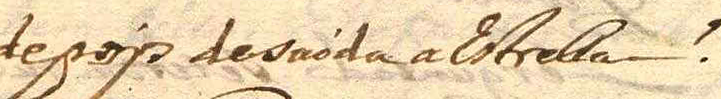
depoiys de saida a Estrella-?
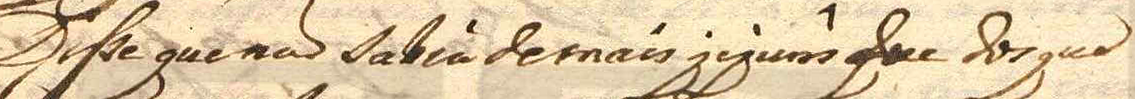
Disse que naõ Sabia de mais jejun̄s que dos que
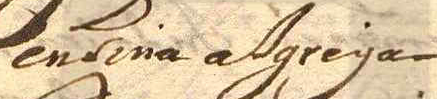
ensina a Jgreya
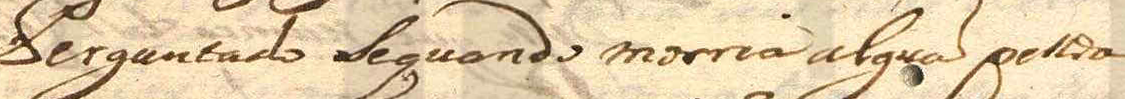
Perguntado se quando morria alguā pessoa
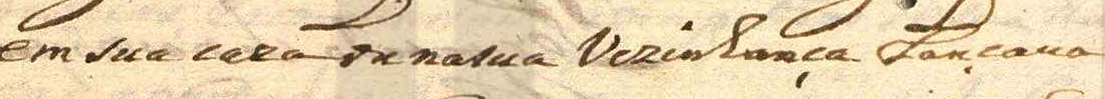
em sua caza ou na sua Vezinhança lançaua
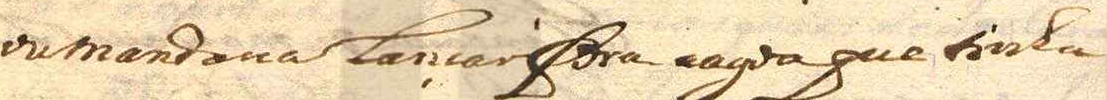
ou mandaua Lançar fora a agoa que tinha
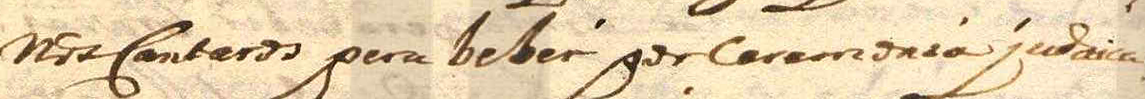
nos Cantaros pera beber por ceremonia judaica
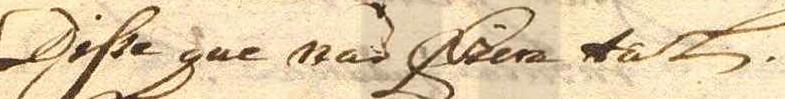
Disse que naõ fizera tal.
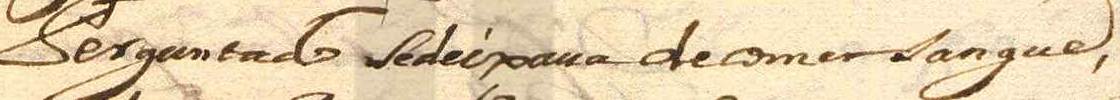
Perguntado se deixaua de comer sangue,
